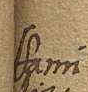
Rami
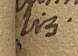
liz.
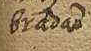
brādaõ
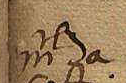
mel da
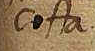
costa
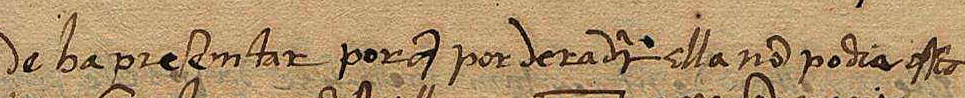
de ha presemtar porq̄ por deradrro Ella nō podia esca
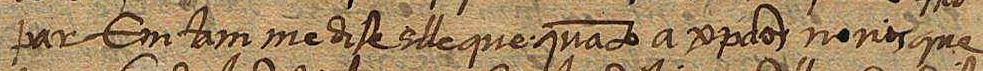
par Emtam me dise Elle que quāto a xpaõs nouos que
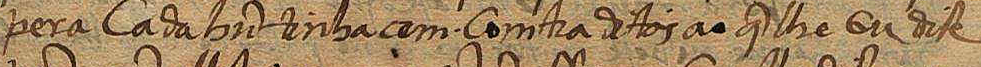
pera Cada hū tinha cem Comtraditas ao q̄ lhe Eu dise
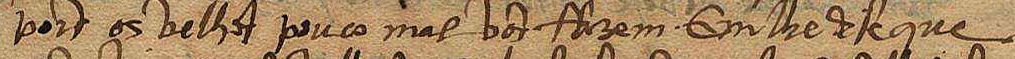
pois os velhos pouco mal vos fazem. Em lhe dise que
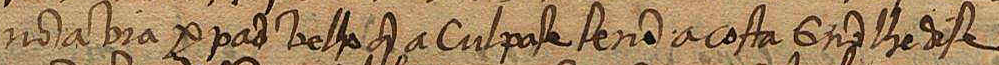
nō avia xpaõ velho q̄ a Culpase senō a costa E nō lhe dise
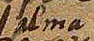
alma
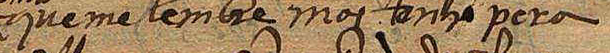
que me lembre mas tenho pera
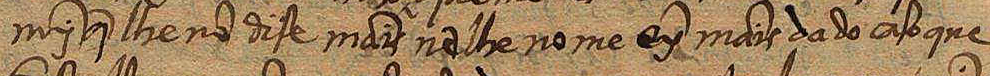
mȳ q̄ lhe nō dise mais nē lhe nomeey mais dado caso que
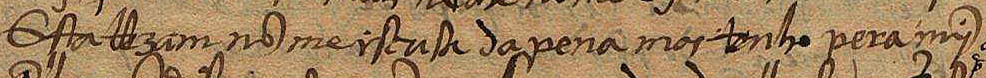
Esta Rezam nō me escusa da pena mas tenho pera mȳ
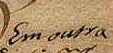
Em outra
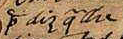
pe diz q̄ lhe
